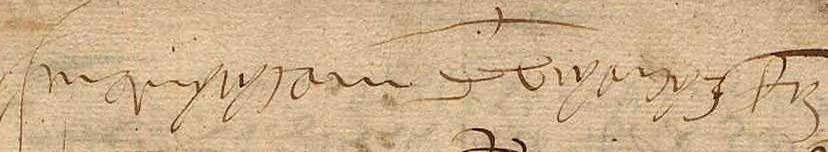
Jmquyrycam de bryartyz frz
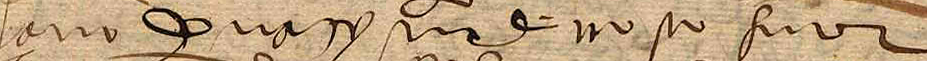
ano do nacymto de noso Sn̄or
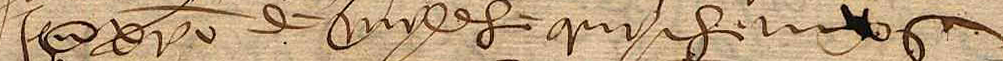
Jhū x̄po de myll he quynhemtos
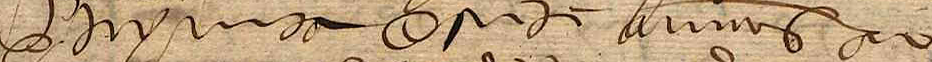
e trymta e sete annos ao
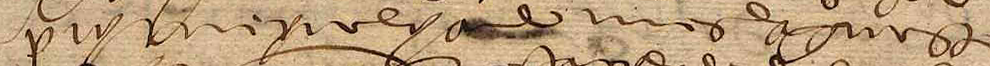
prymeyro dya do mes daguosto
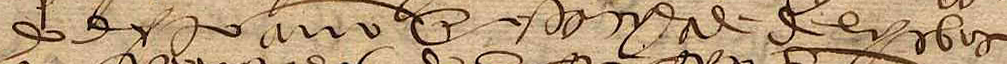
do dyto āno ē esta cidade de lysboa
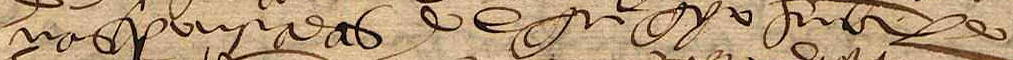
nas pousadas do egregyo S̄nor Ldo
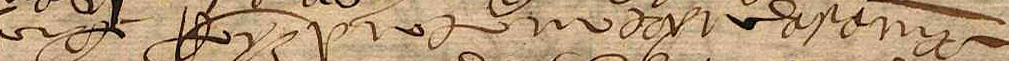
Jorge Rōyz proto notayro da samta
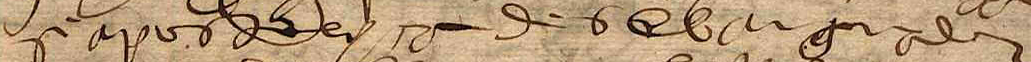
se apostolyca desēbargador
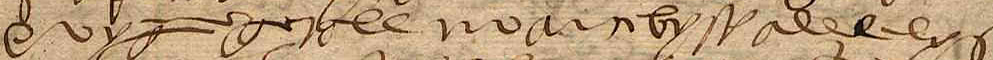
e vygro gerall no arcebyspado de lys
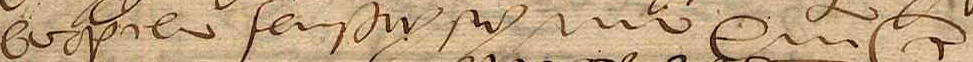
boa pelo Jlustrysymo e mto ē
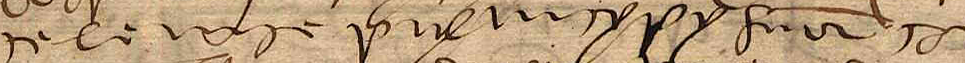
celemte prymcypy Sn̄or car
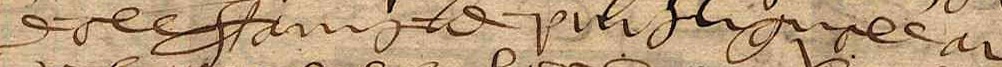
deall Jfamte de purtuguall ar
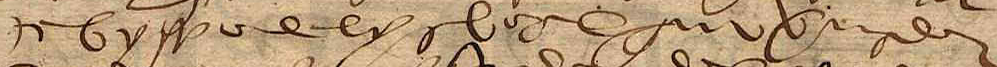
cebyspo de lysboa e guoꝟnador
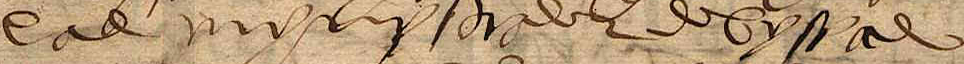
e admynystrador do byspado
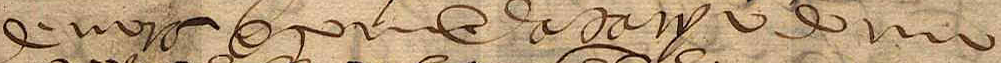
deuora e comēdataryo do mo
